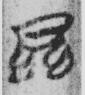㬎（顯）
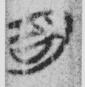明
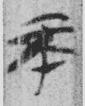不
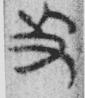及
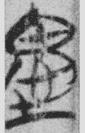{愧土}
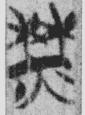焚
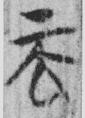而
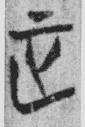正
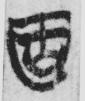固
